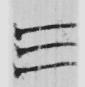三
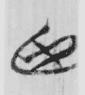臣
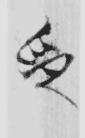卬
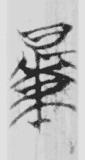{日朿}
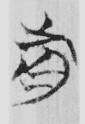歬
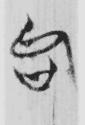句
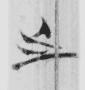之
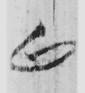㠯（以）
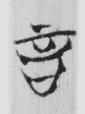言
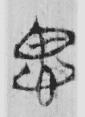思
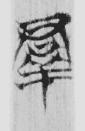羣
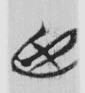臣
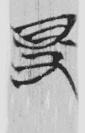𠭁
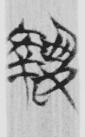執
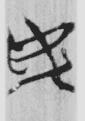𡚦
